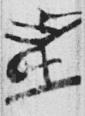者（諸）
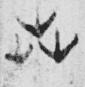卉（草）
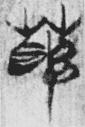茅
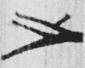之
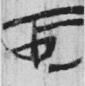𠁩
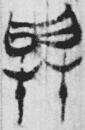與
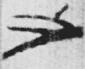之
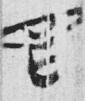言
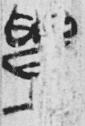豊（禮）
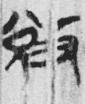敓
